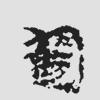軍
